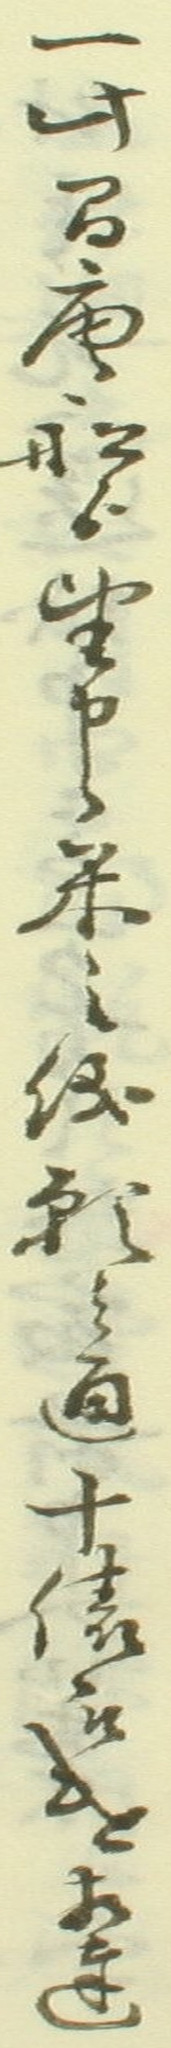一此間唐船ゟ望申候米之儀願之通十俵被遣相達
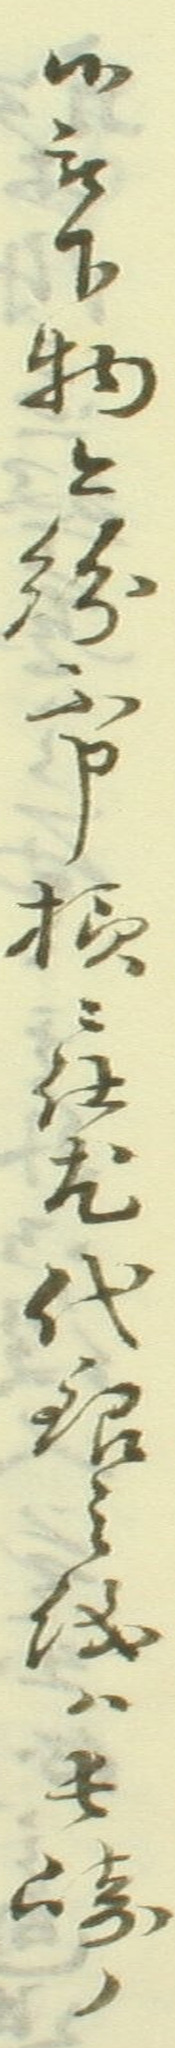候被下物と紛不申様に仕尤代銀之儀は長崎ノ
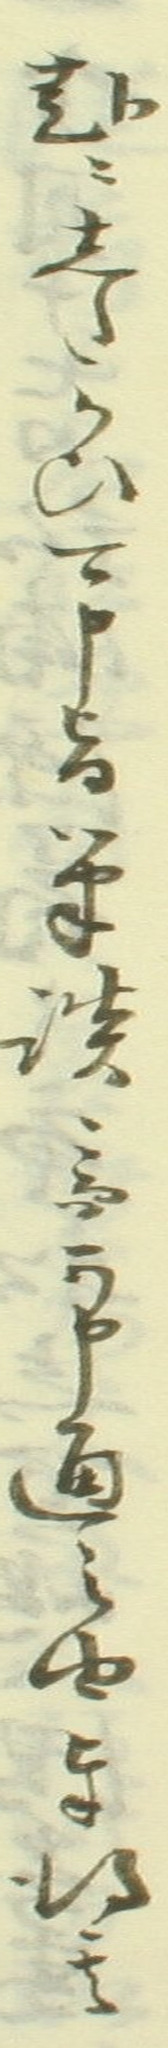赴にしたかひ可申旨筆談に而可申通之由奉得其
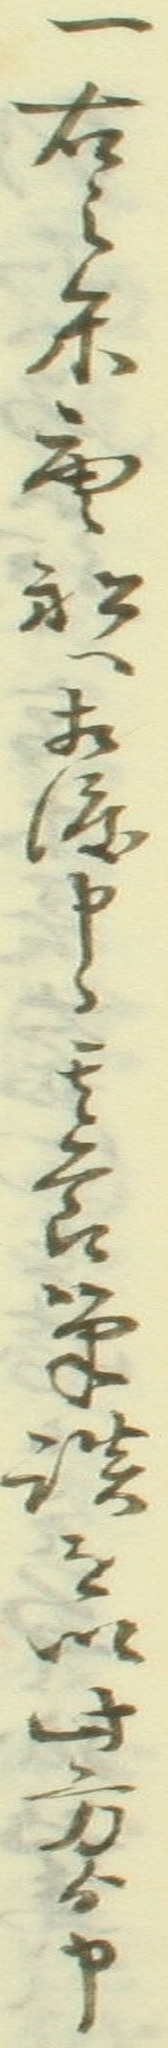一右之米唐船へ相渡申候其節筆談を以此方ゟ申
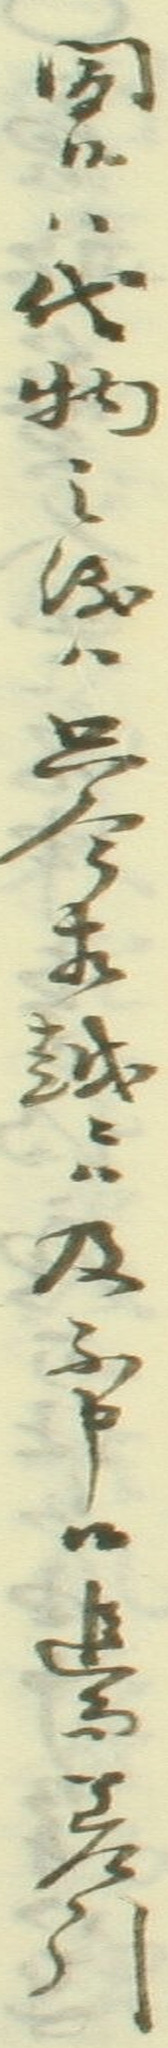聞候は代物之儀は只今相越には及不申候追而差引
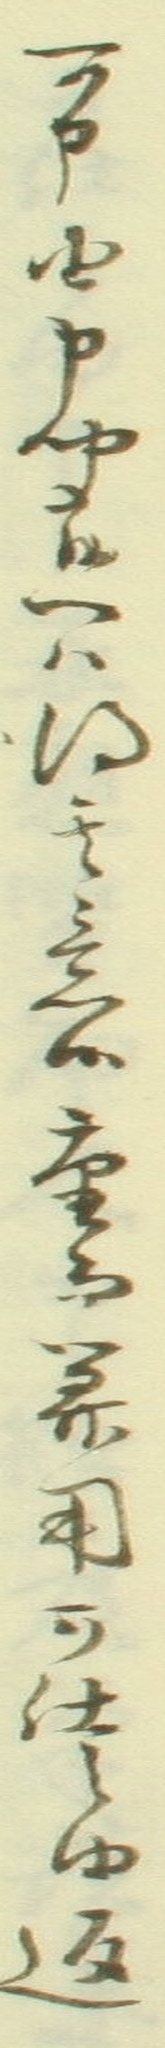可申由申聞候へは得其意候重而算用可仕之由返
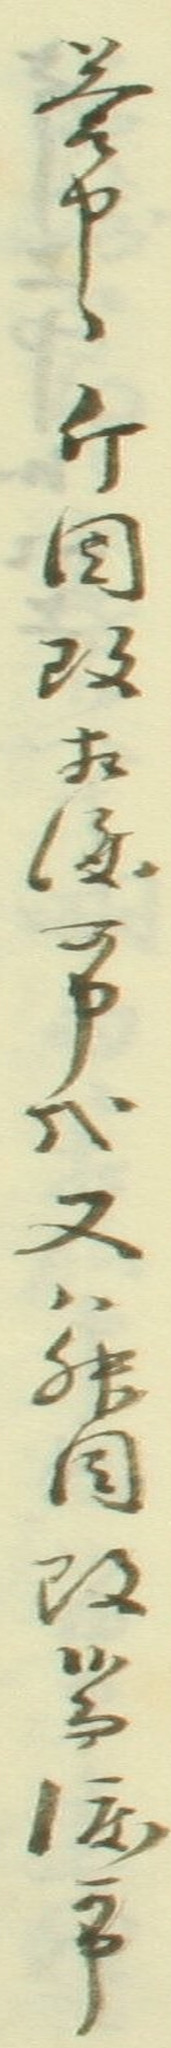答申候斤目改相渡可申哉又は升目改候而渡可申
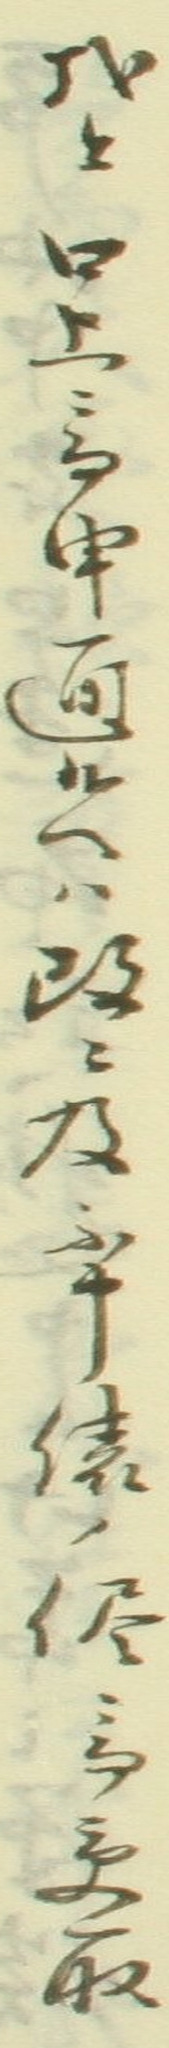哉と口上に而申通候へは改に及不申俵ノ侭に而受取

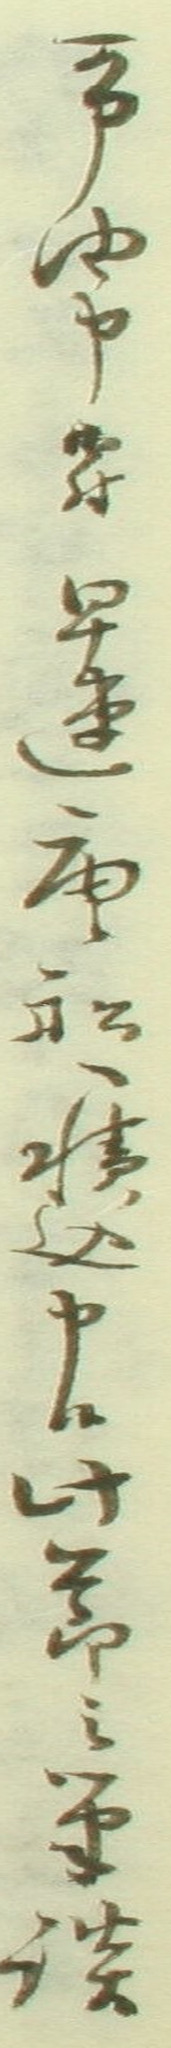可申由申候付早速唐船へ積込申候此節之筆談
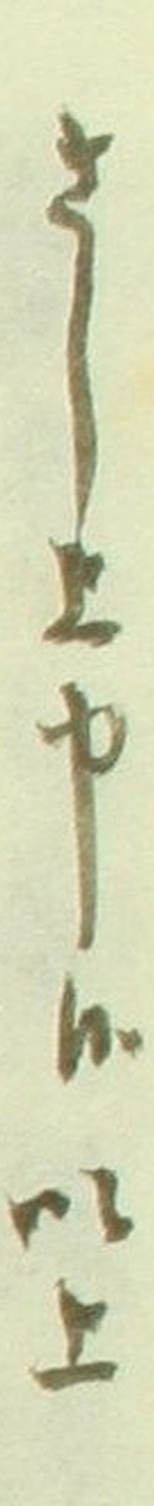さし上申候以上
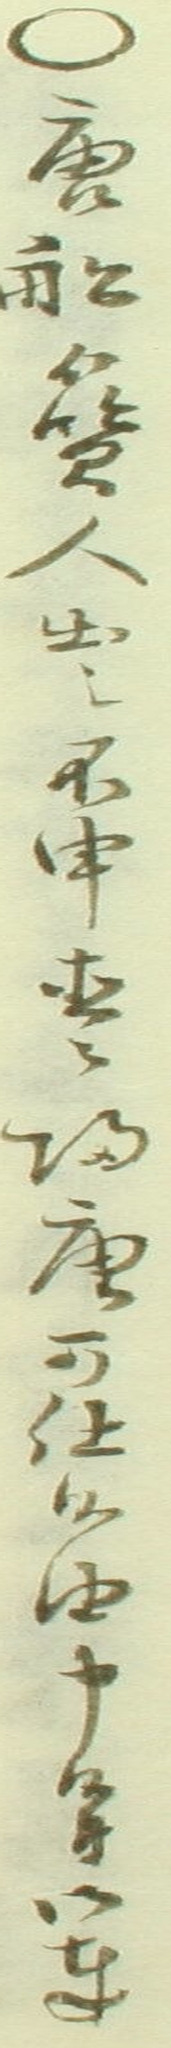〇唐船ゟ質人出し不申直に帰唐可仕候由申候付御奉
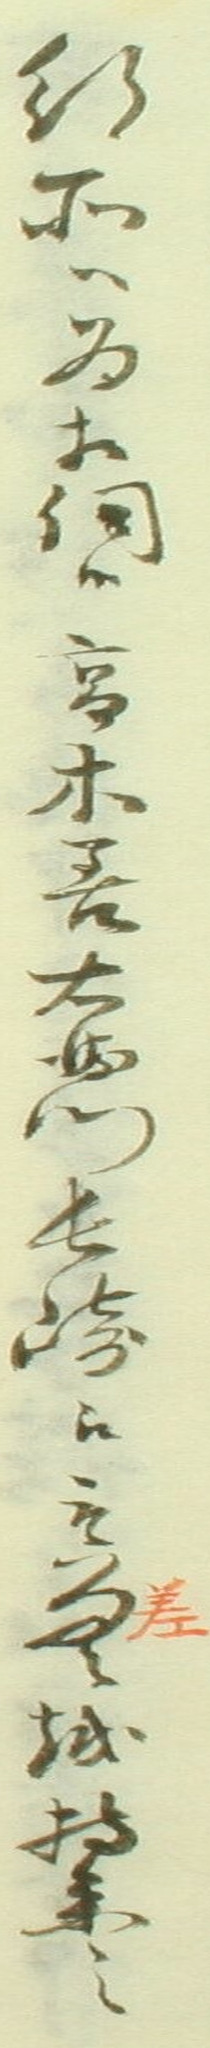行所へ為相伺候高木善右衛門長崎え被差越持参之
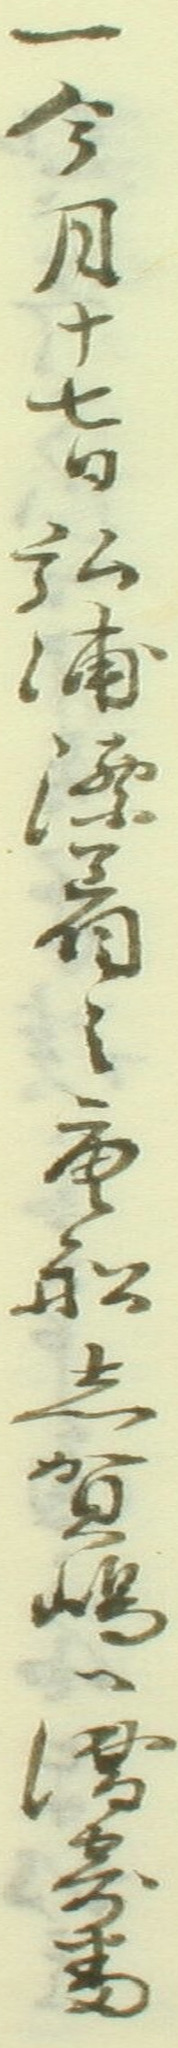一今月十七日弘浦漂着之唐船志賀島へ漕寄番
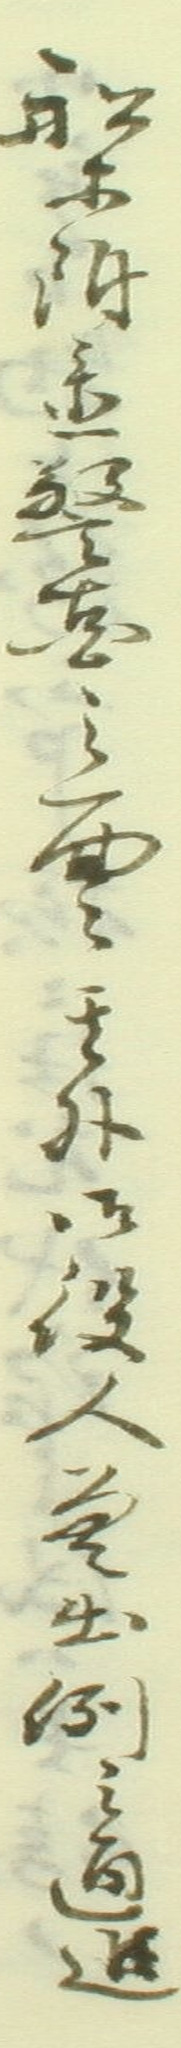船等附置警固之面々其外御役人差出例之通追
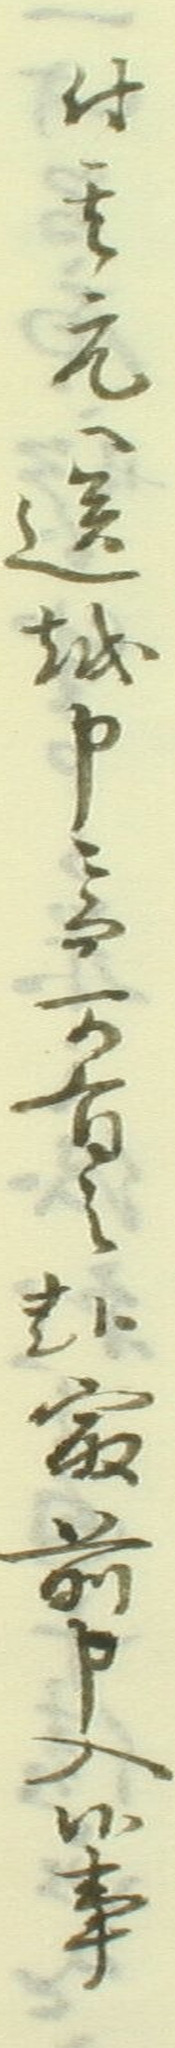付其元へ送越申に而可有之赴最前申入候事
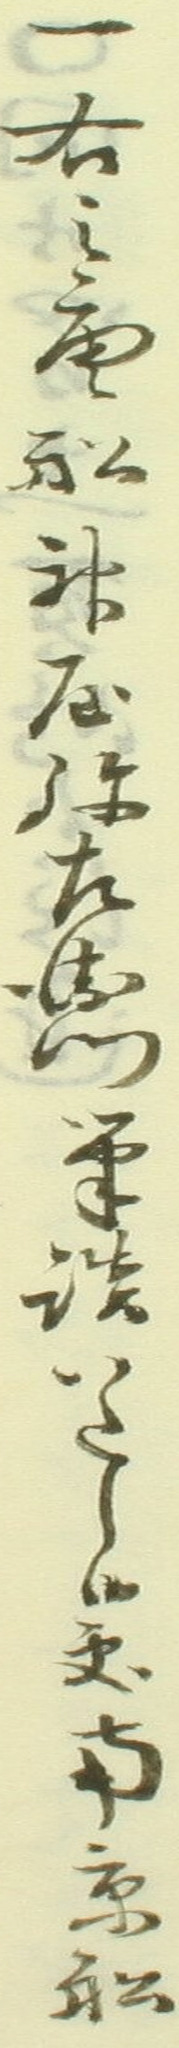一右之唐船神屋弥左衛門筆談いたし候処南京船
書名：異国船漂着記
